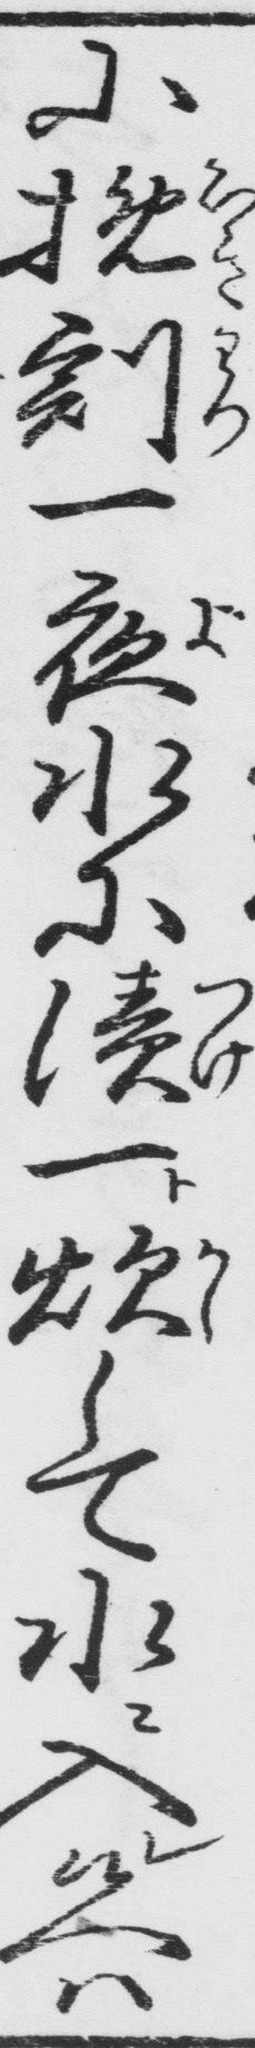に挽割一夜水に漬一ト炊して水に入れ候へは
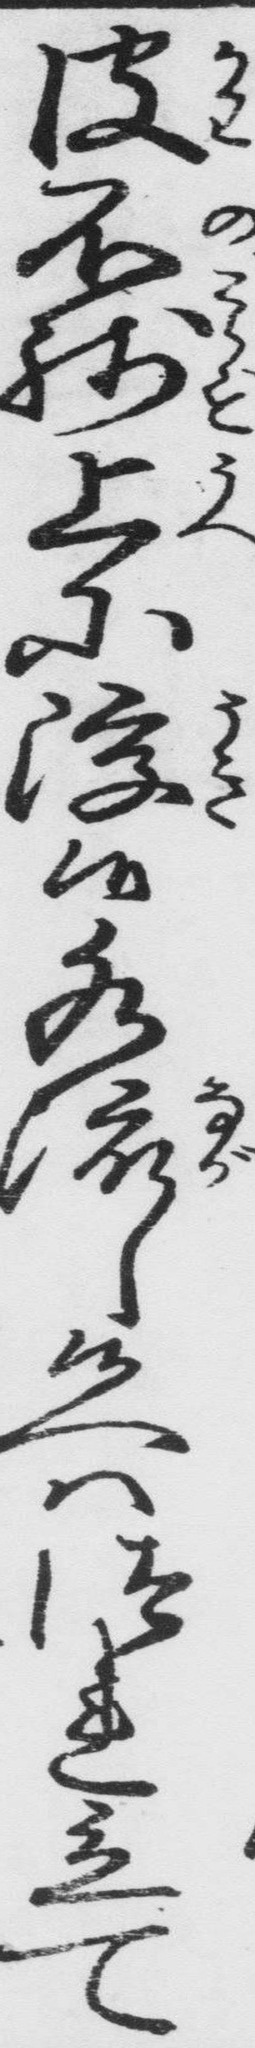皮不残上に浮候水流し候へはつれ立て
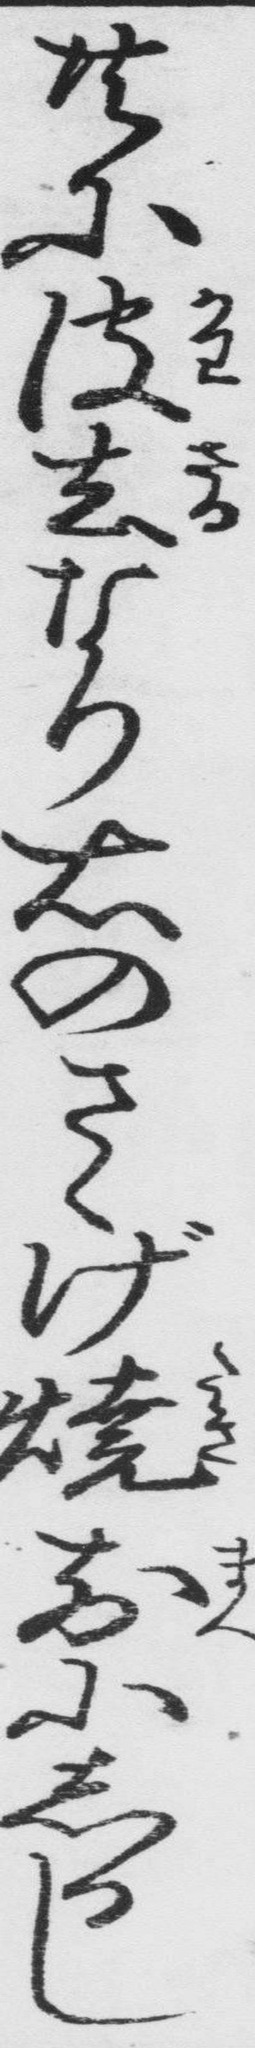共に皮去なり右のさゝげ焼前にしるし
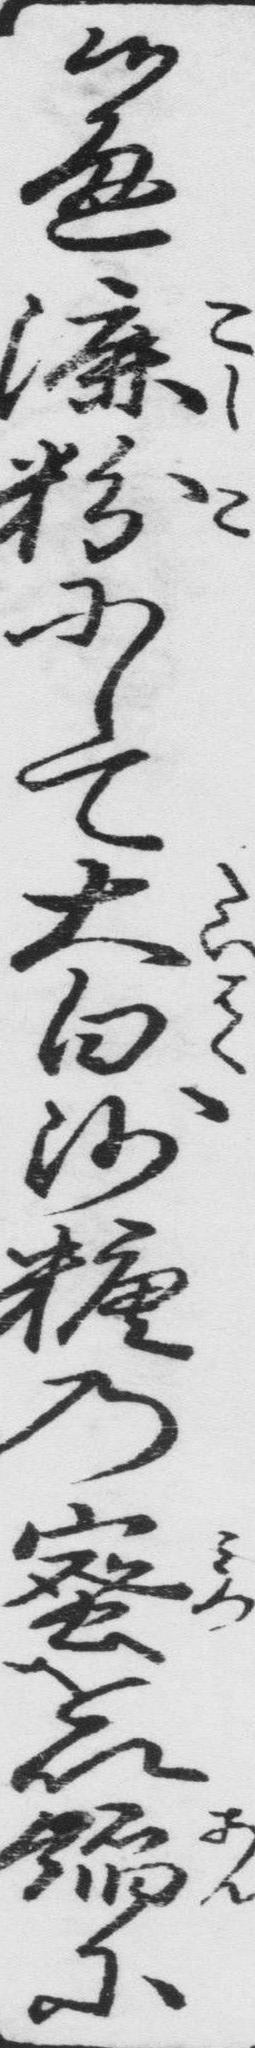候通漉粉にして大白沙糖の蜜を以餡に

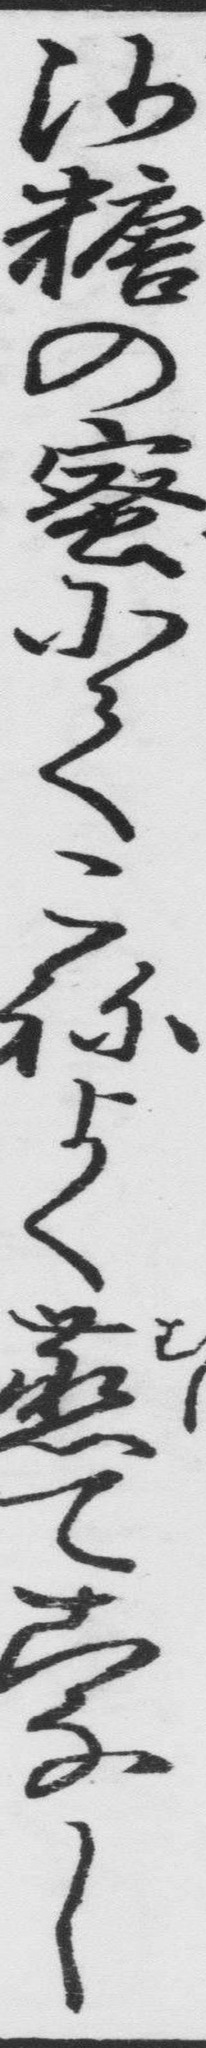沙糖の蜜にてこねよく蒸てこなし
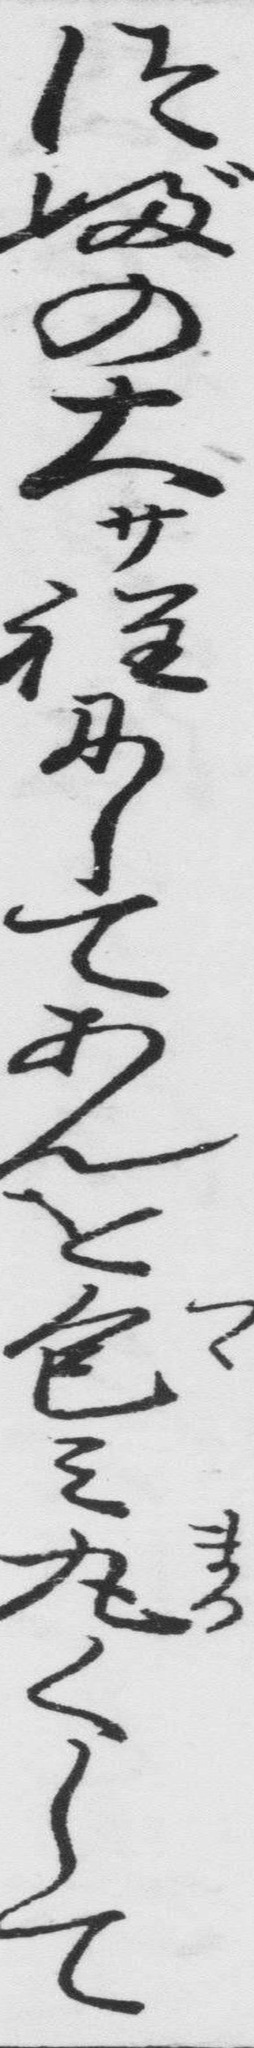つぶの大さ程にしてあんを包み丸くして
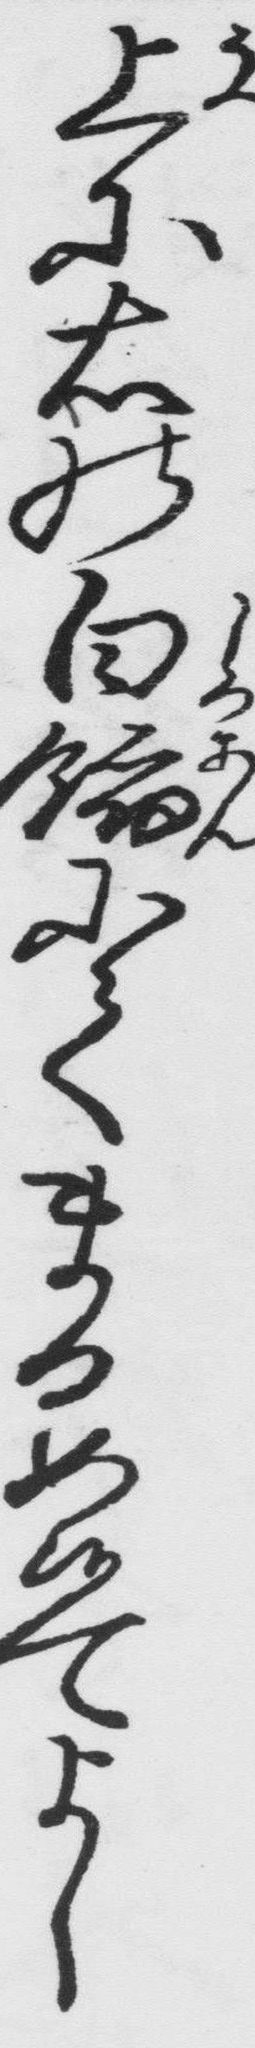上に右の白餡にてまるめ候てよし
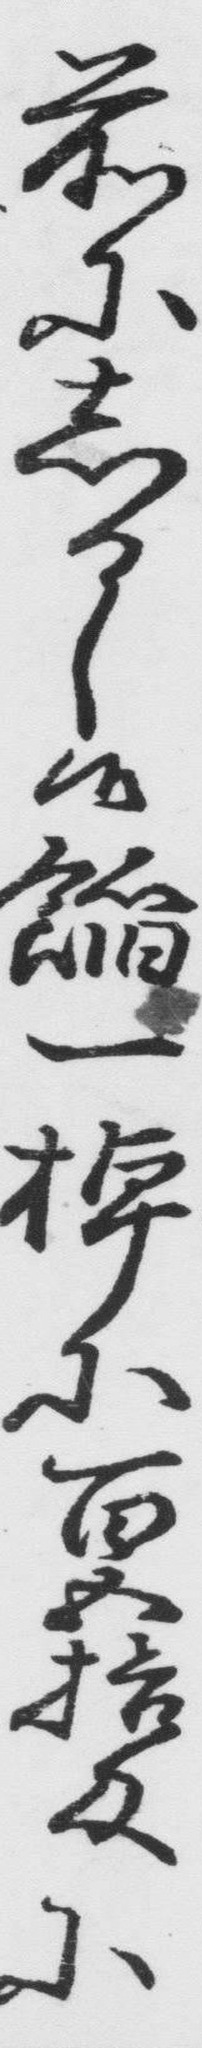前にしるし候餡一棹に百五拾匁に
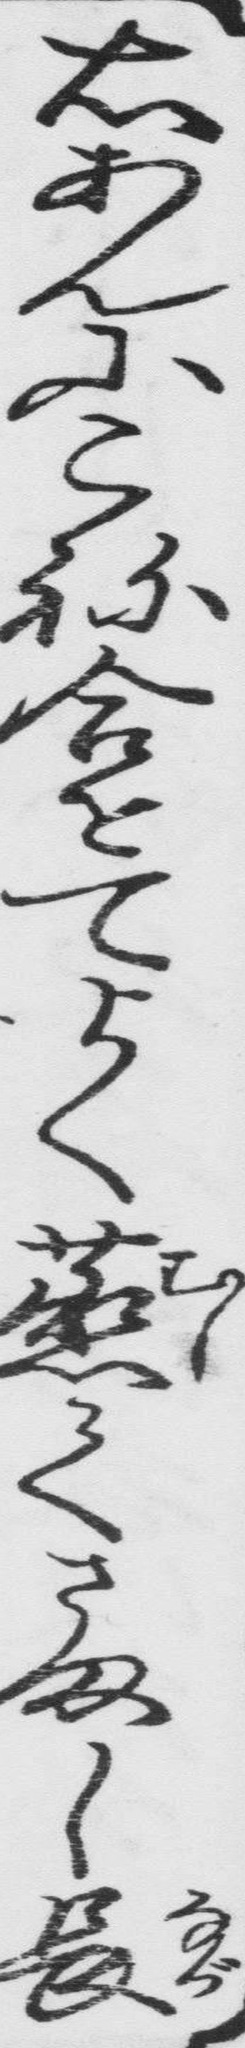右あんにこね合せてよく蒸てさまし長
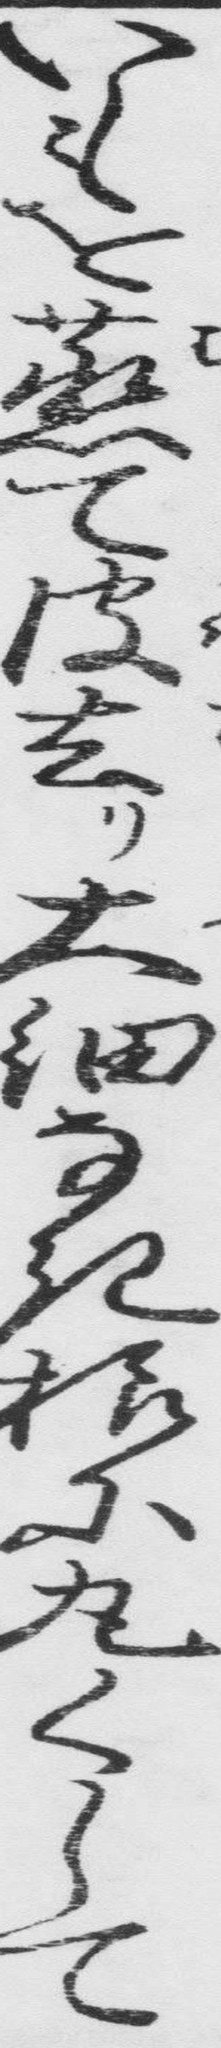いもを蒸て皮去り大細なき様に丸くして
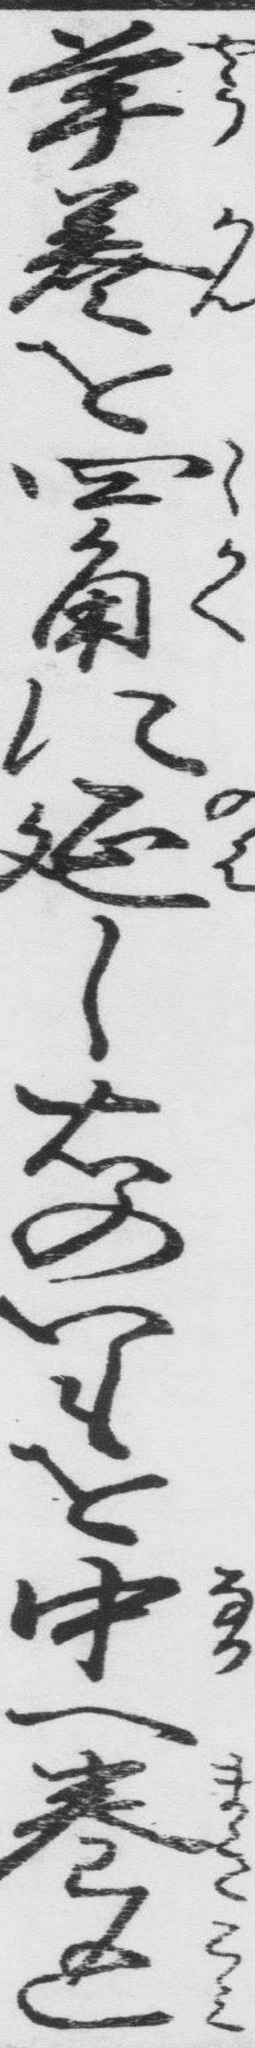羊羹を四角に延し右のいもを中へ巻込
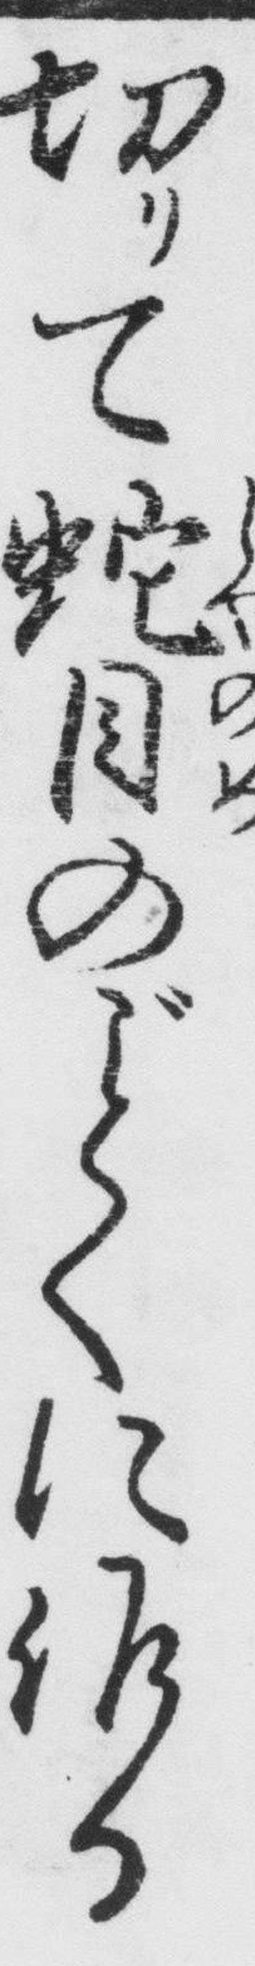切りて蛇目のごとくに作る
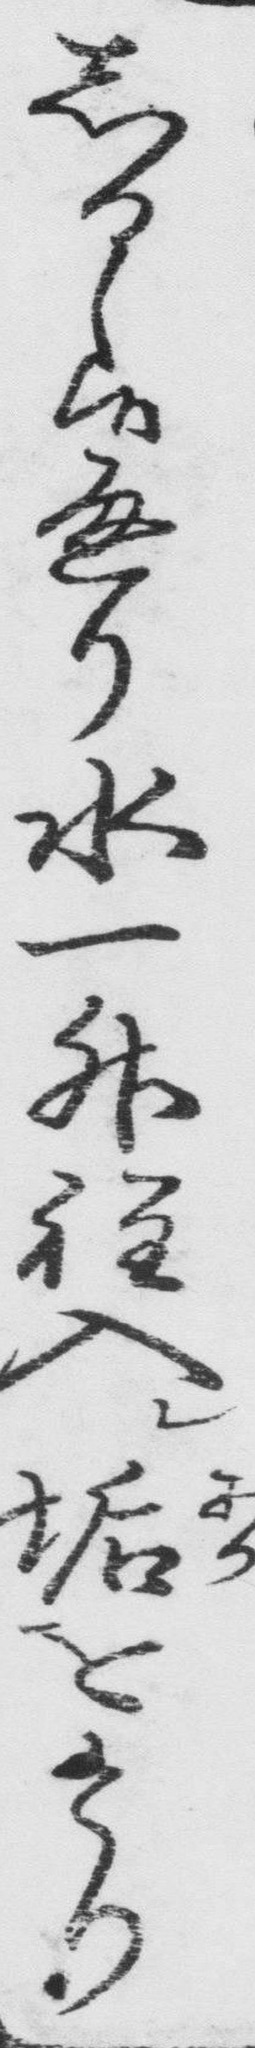しるし候通り水一升程入れ垢をとり

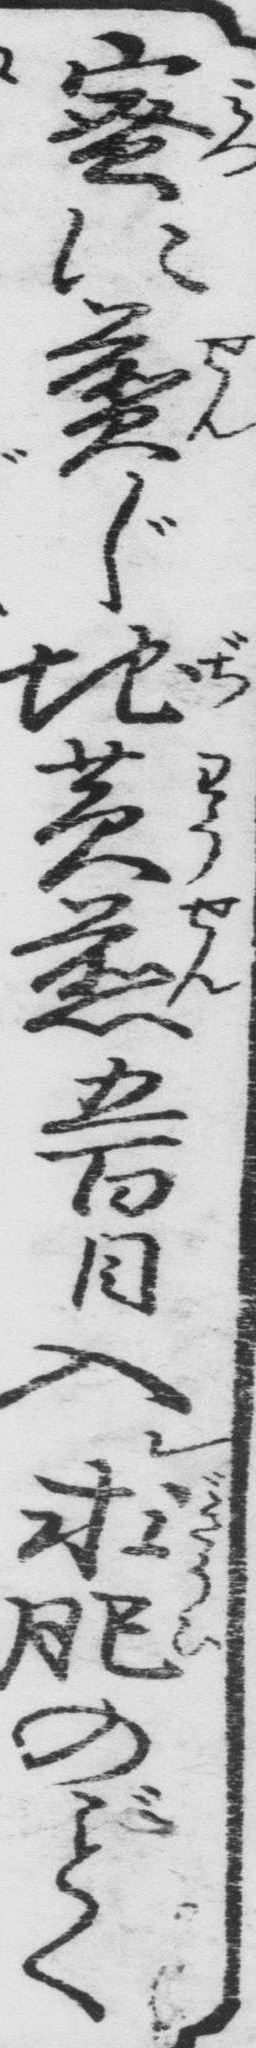蜜に煎じ地黄煎五百目入れ求肥のごとく
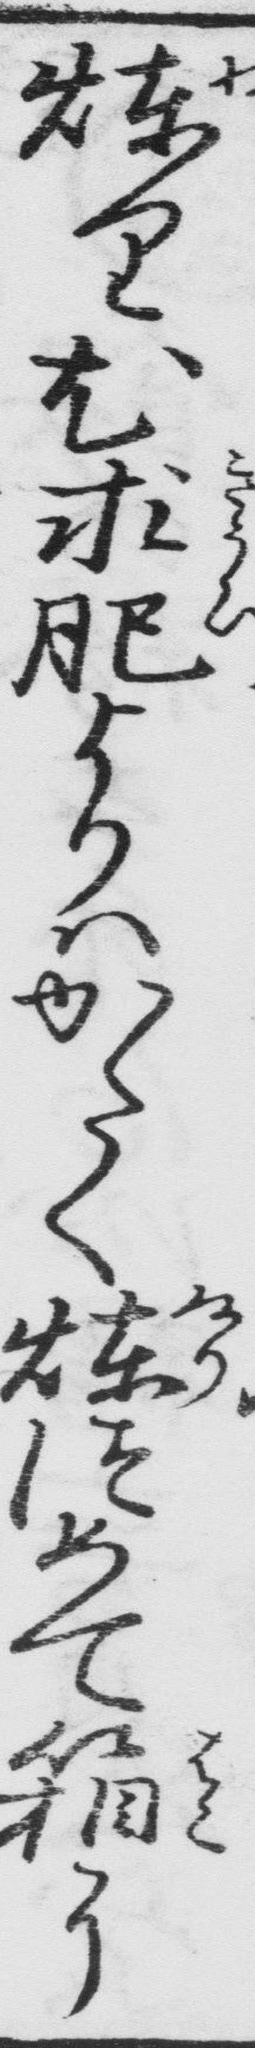煉り尤求肥よりはかたく煉つめて箱に
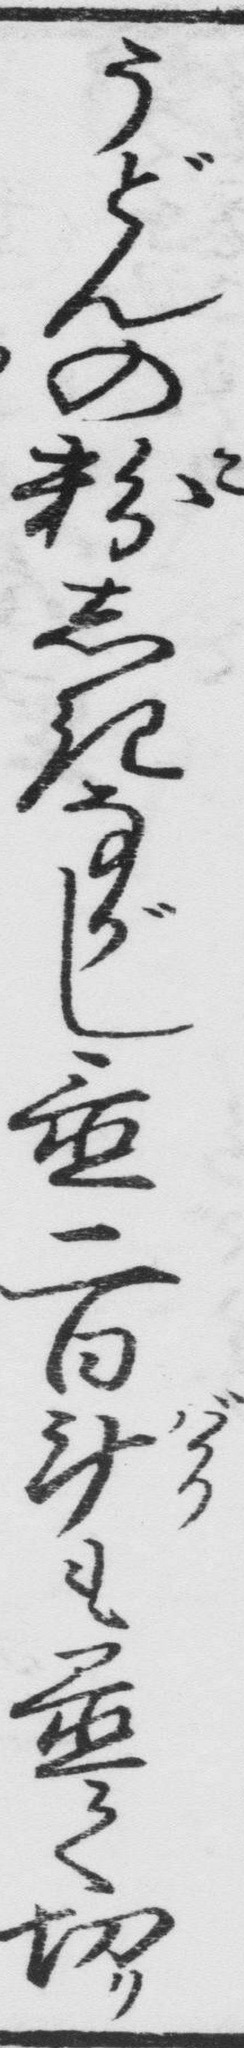うどんの粉しきながし置き二日斗も置て切り
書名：御前菓子図式
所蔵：大阪府立大学学術情報センター 国文学研究資料館
